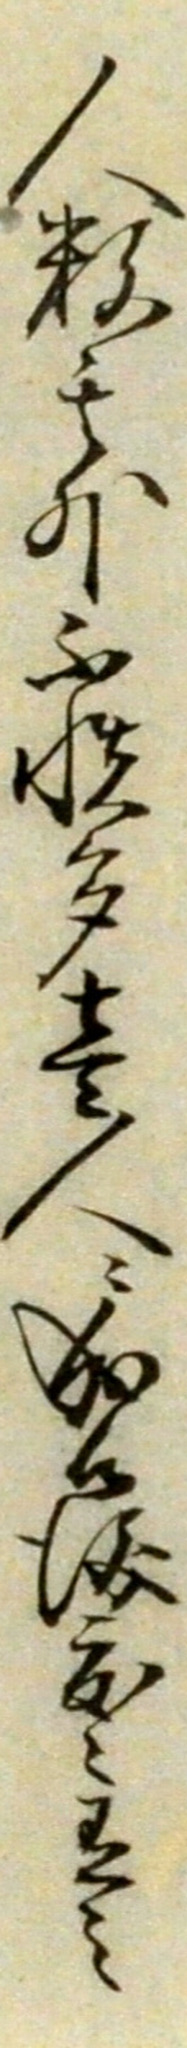人数其外不快多壱人に成候儀度々有之
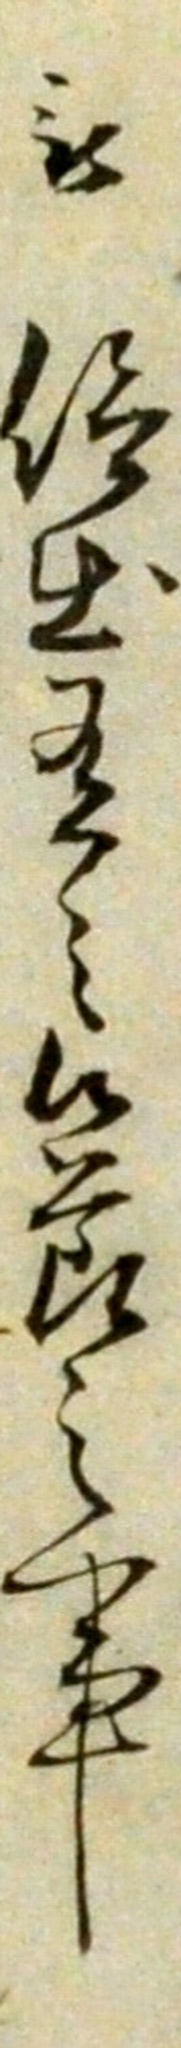被仰出有之候節之事
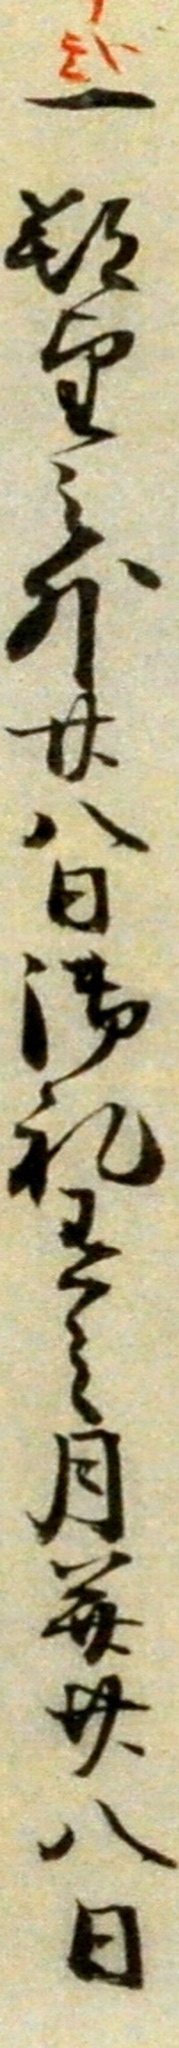一朔望之外廿八日御礼有之月并廿八日
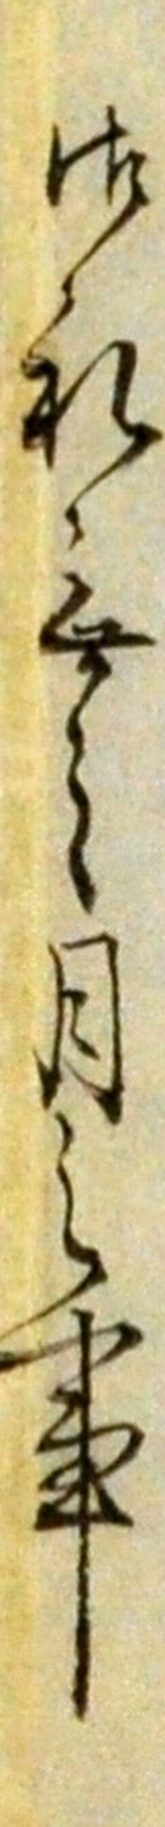御礼無之月之事
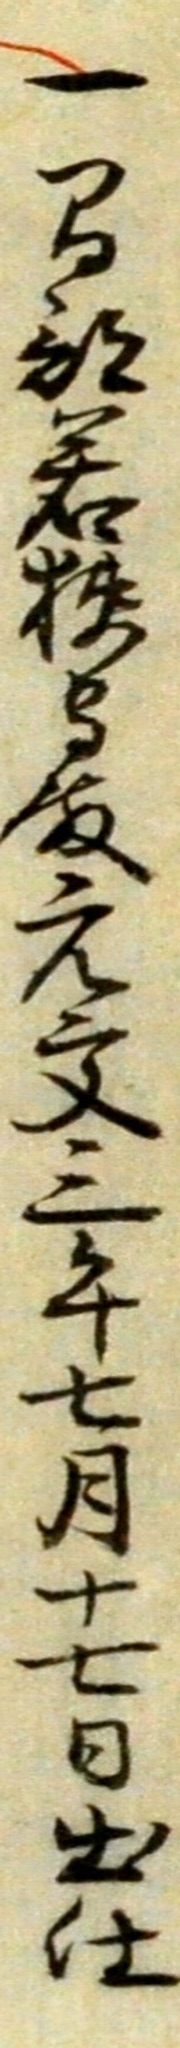一間部若狭守殿元文三午七月十七日出仕
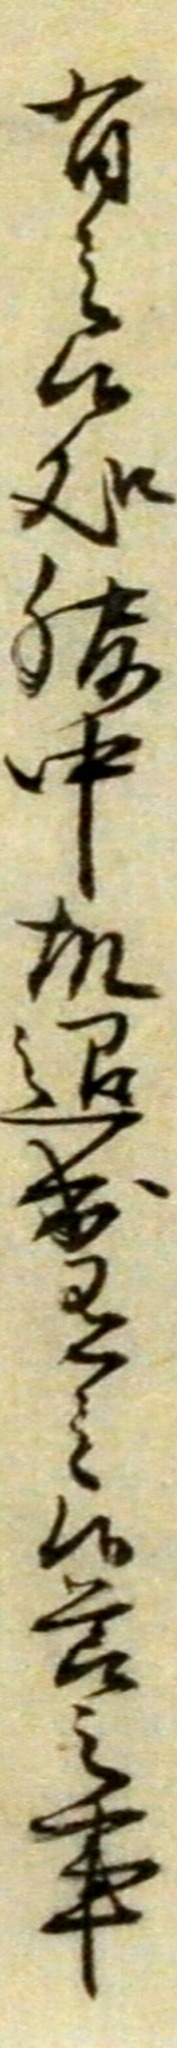有之候処服中故退出有之候節之事
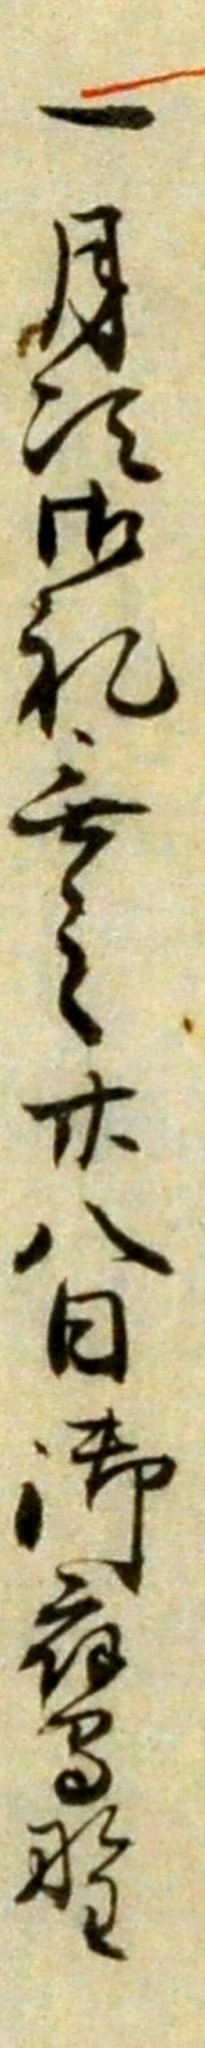一月次御礼無之廿八日御鷹野
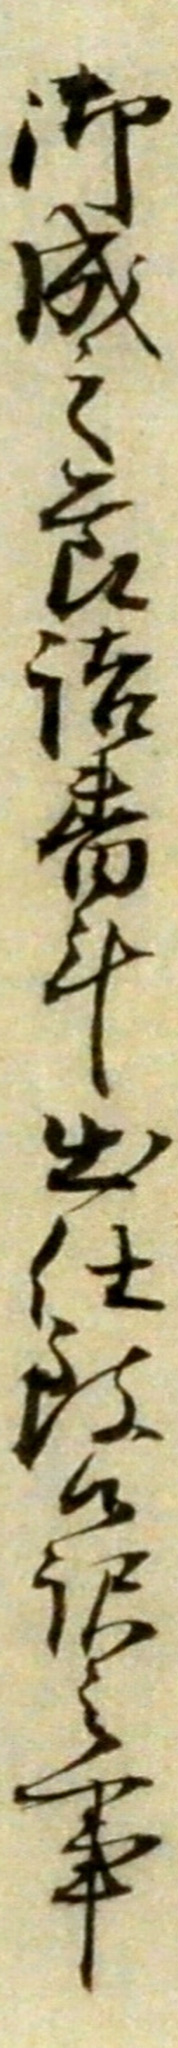御成之節詰番斗出仕致候訳之事
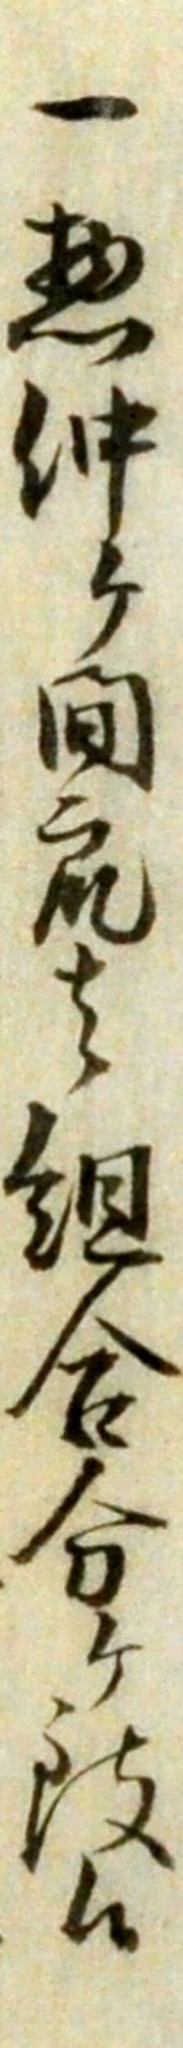一惣仲ヶ間衆は組合分ケ致候
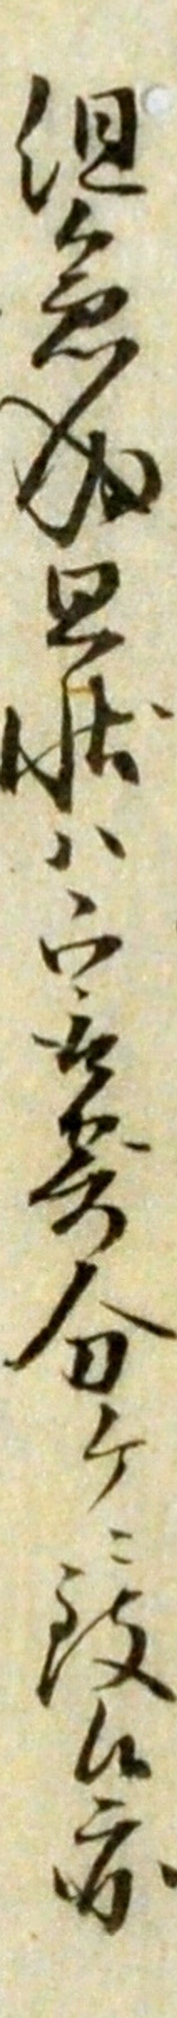但急成廻状は最寄分ケに致候亦
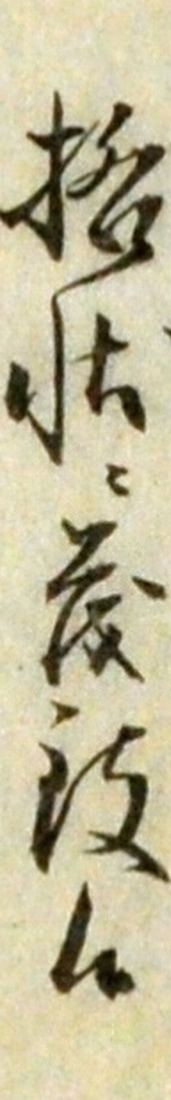格状にも致候
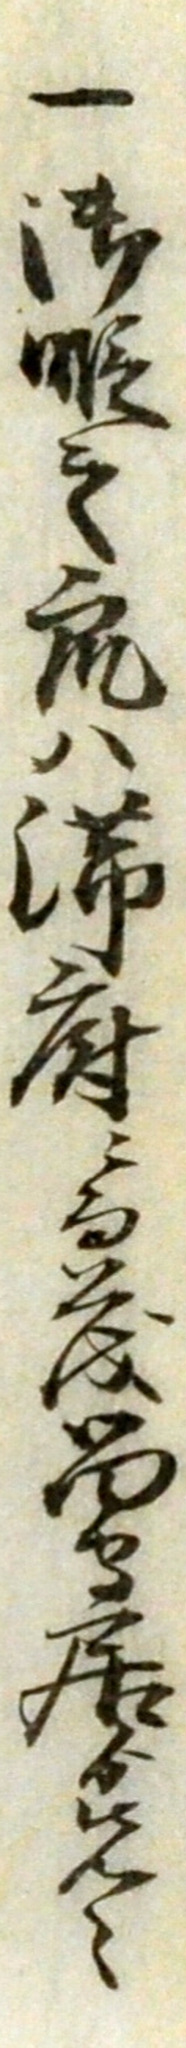一御暇之衆は滞府にても留守居ゟ先々
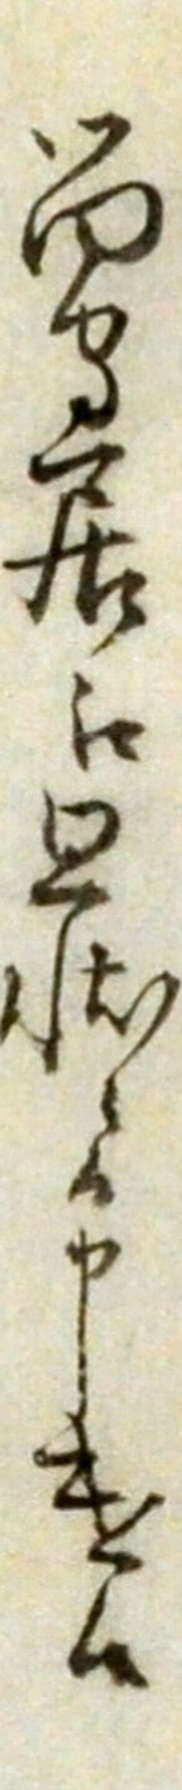留守居え廻状にて申遣候
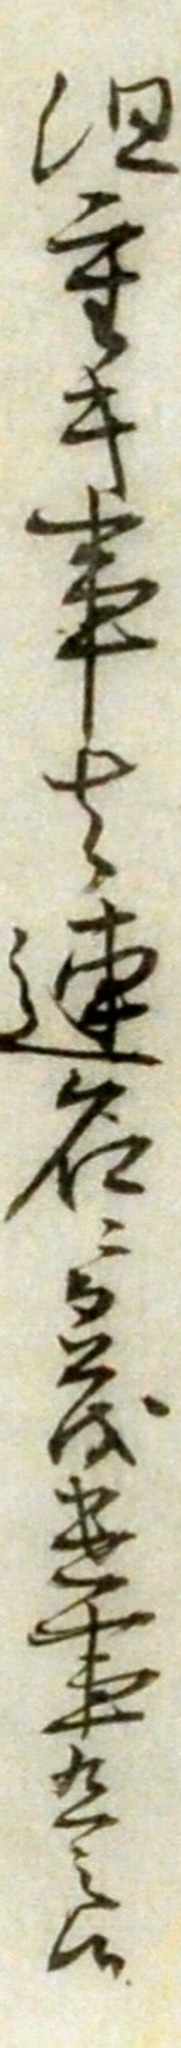但重キ事は連名にても遣事有之候
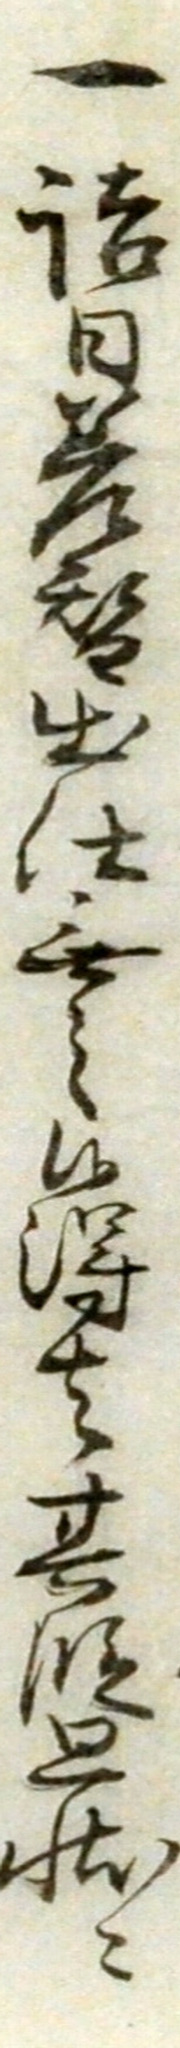一詰日差替出仕無之候得は其段か廻状に
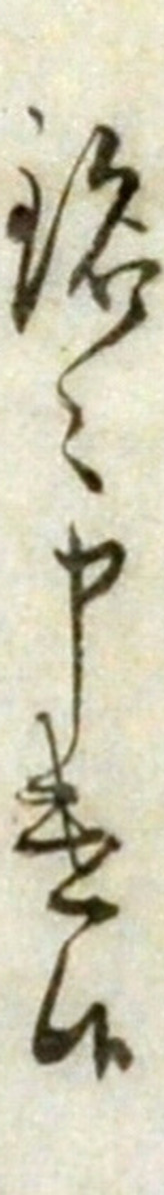銘々申遣候
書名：申合帳〔一括〕
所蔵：伊那市立高遠町図書館・合同会社AMANE
